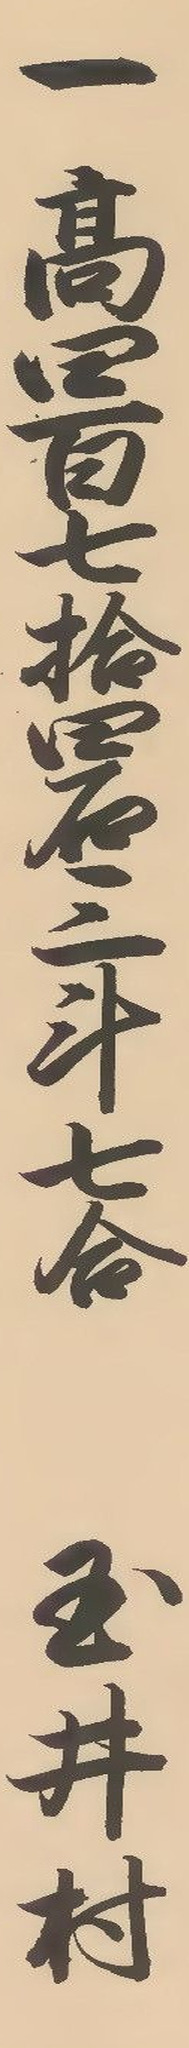一高四百七拾四石三斗七合玉井村
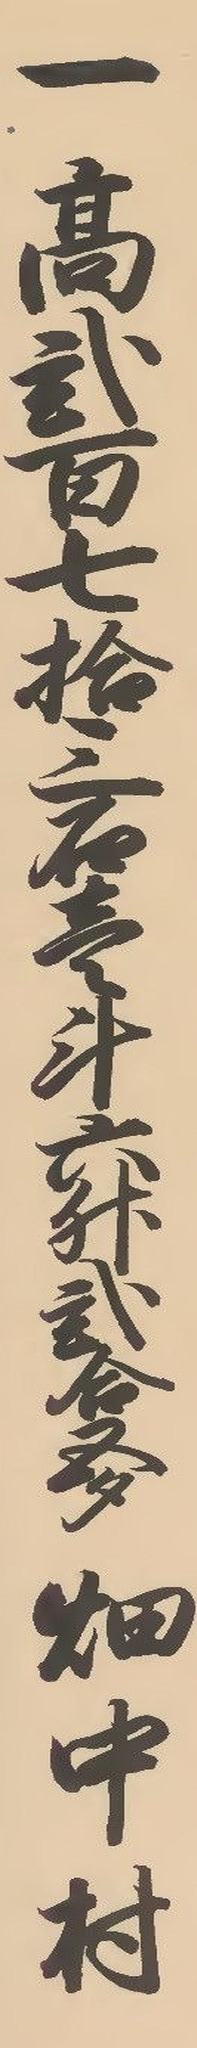一高弐百七拾三石壱斗六升弐合五勺畑中村
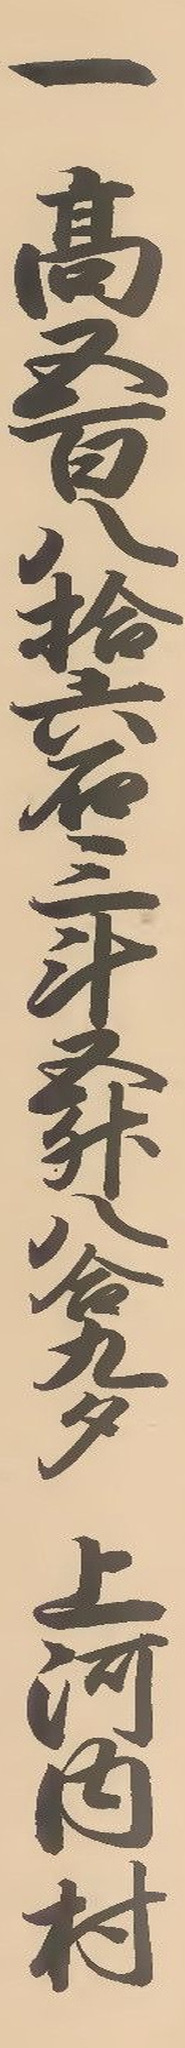一高五百八拾六石三斗五升八合九勺上河内村
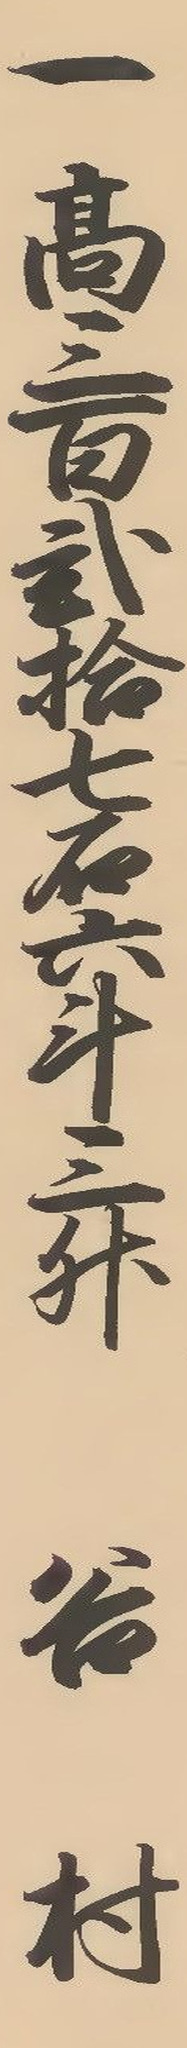一高三百弐拾七石六斗三升谷村
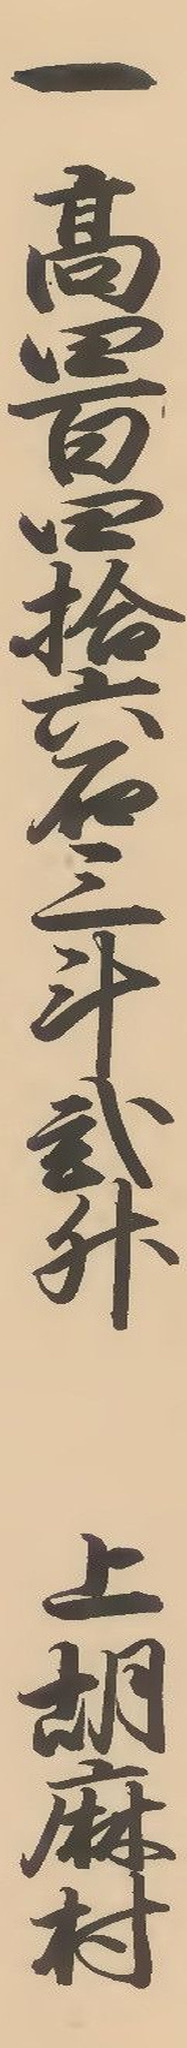一高四百四拾六石三斗弐升上胡麻村
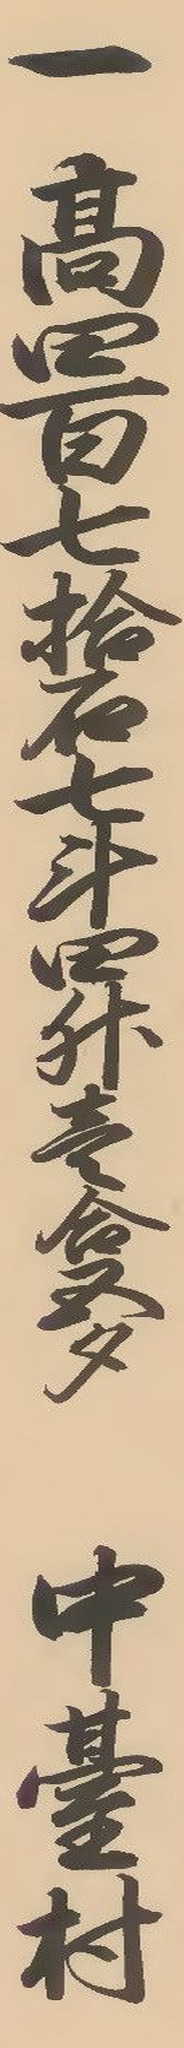一高四百七拾石七斗四升壱合五勺中台村

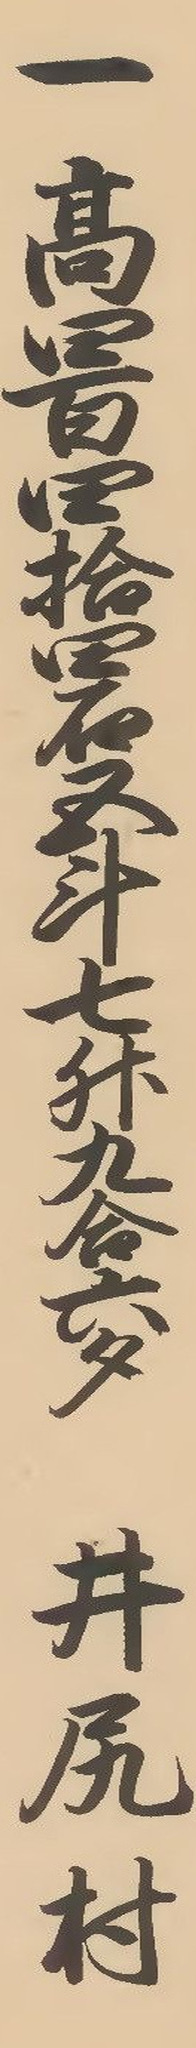一高四百四拾四石五斗七升九合六勺井尻村
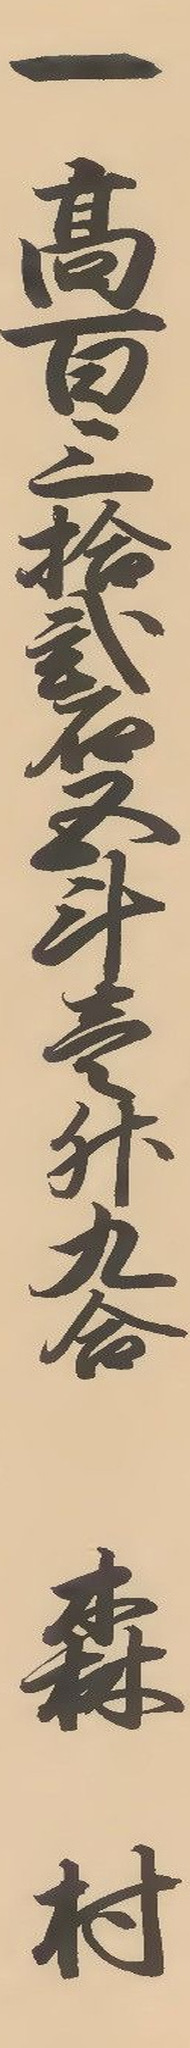一高百三拾弐石五斗壱升九合森村
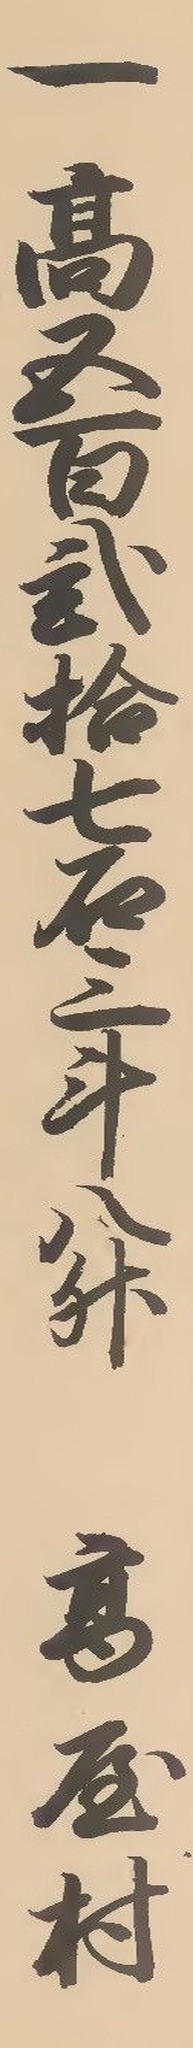一高五百弐拾七石三斗八升高屋村
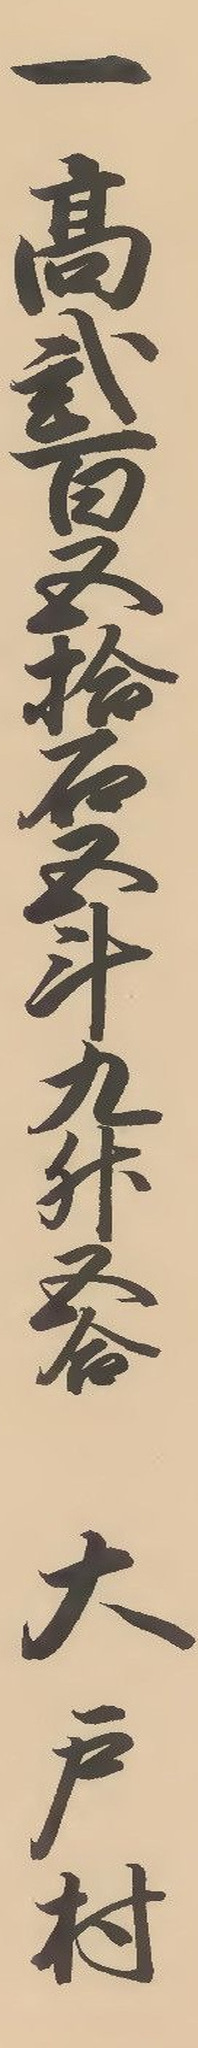一高弐百五拾石五斗九升五合大戸村
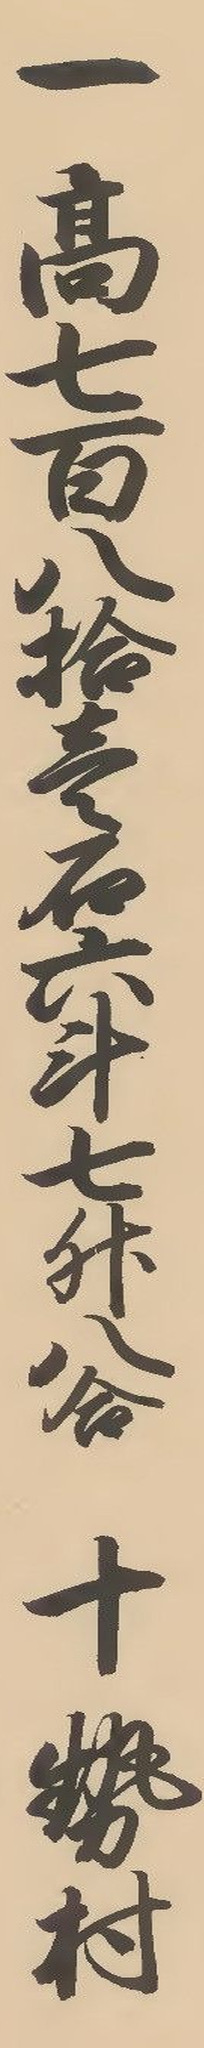一高七百八拾壱石六斗七升八合十勢村

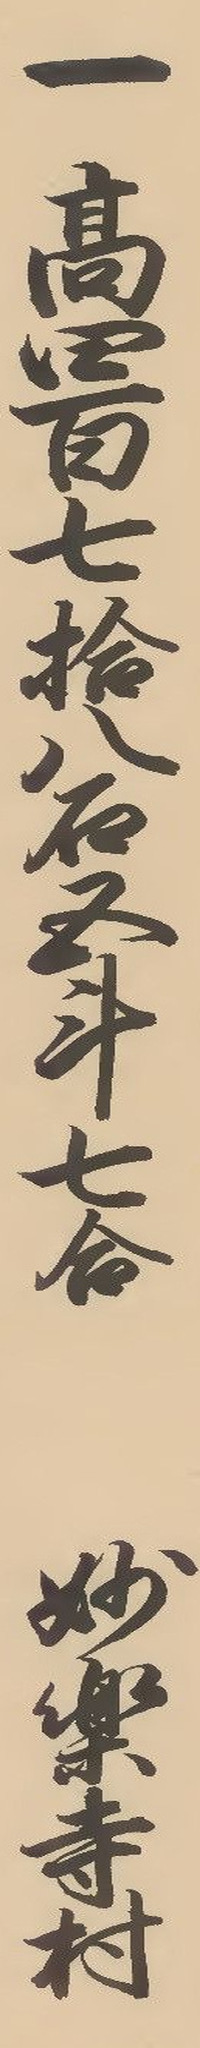一高四百七拾八石五斗七合妙楽寺村
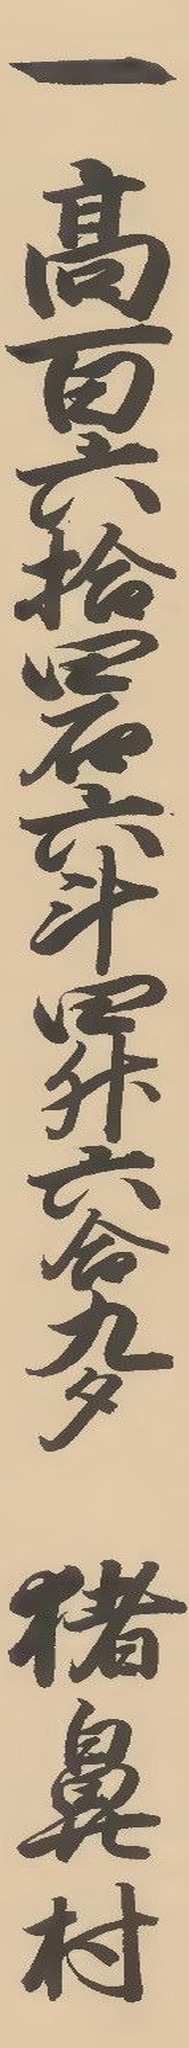一高百六拾四石六斗四升六合九勺猪鼻村
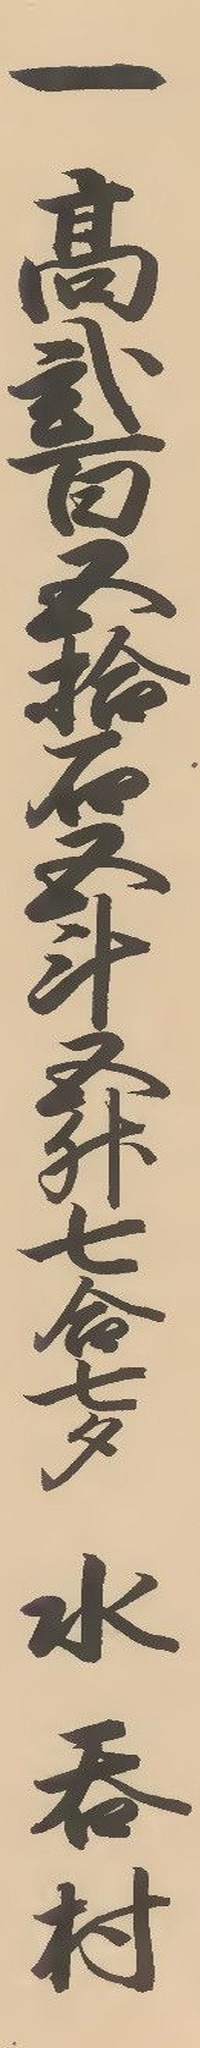一高弐百五拾石五斗五升七合七勺水呑村
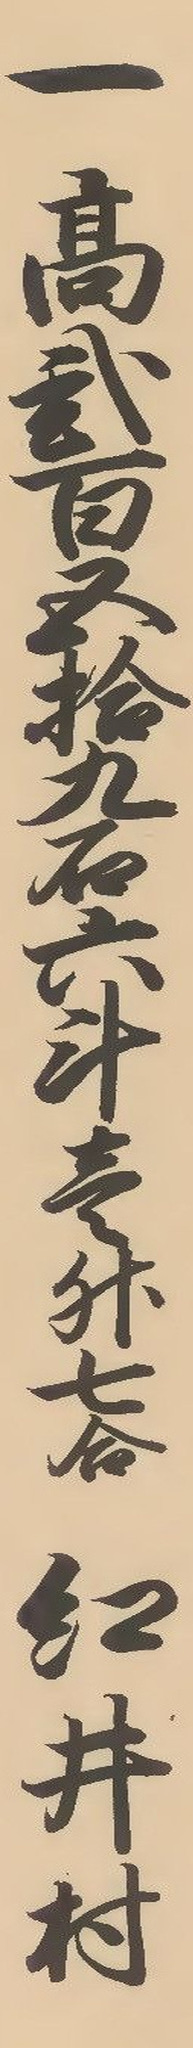一高弐百五拾九石六斗壱升七合紅井村
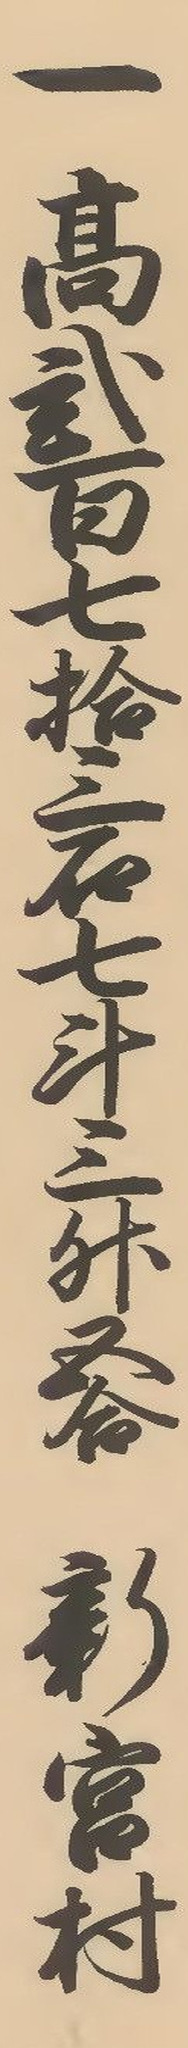一高弐百七拾三石七斗三升五合新宮村
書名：丹波国郷帳
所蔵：国立公文書館 National Archives of Japan
